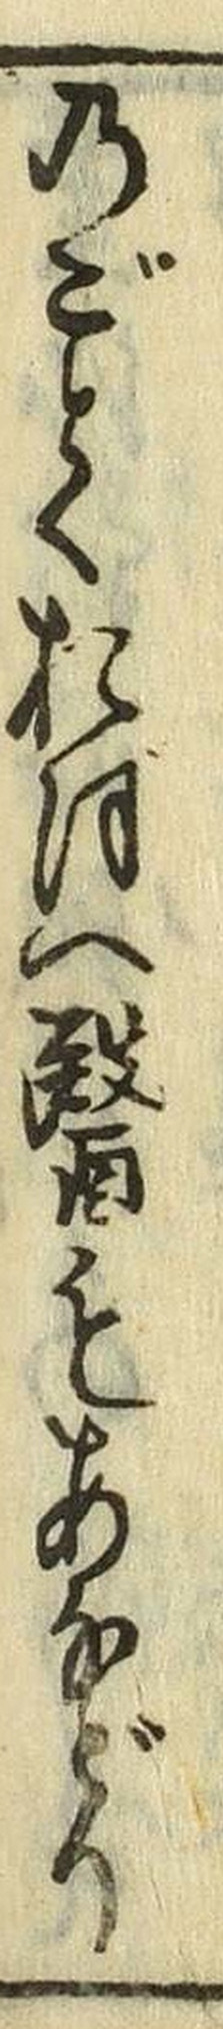のごとくおぼへ医もあなどり
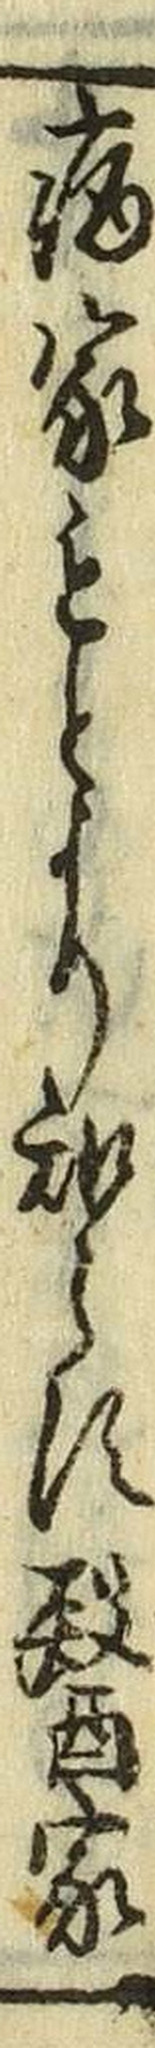病家もとより知らす医家
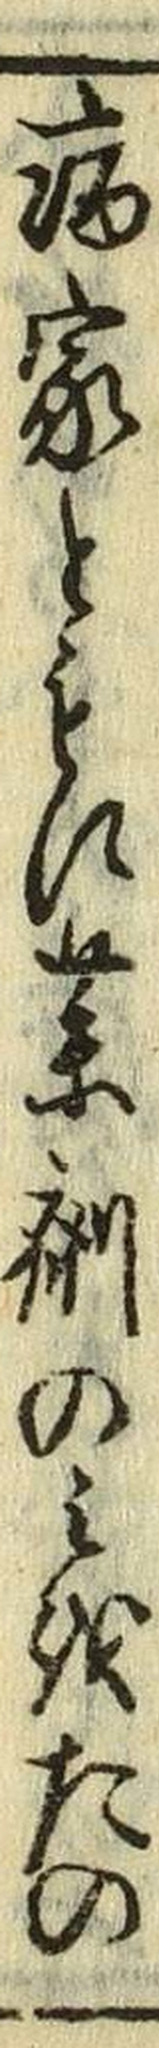病家ともに薬剤のみをたの
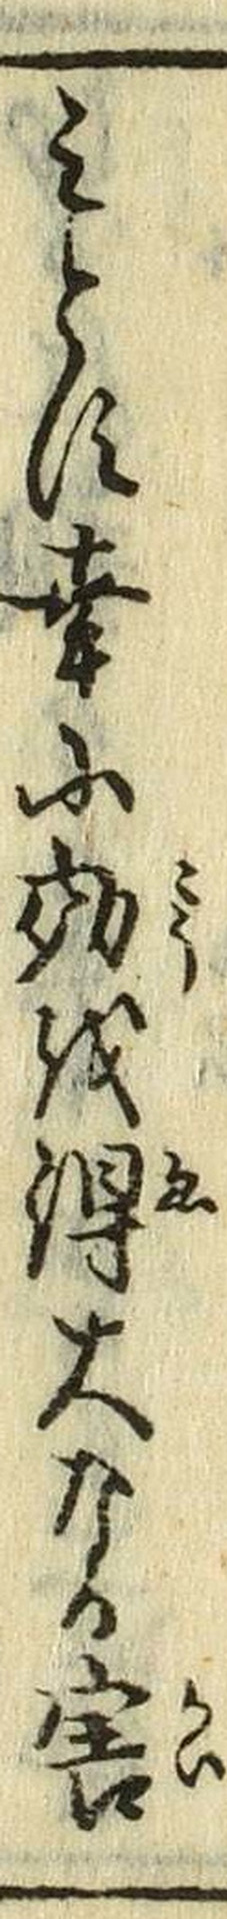みとす幸に効を得大なる害
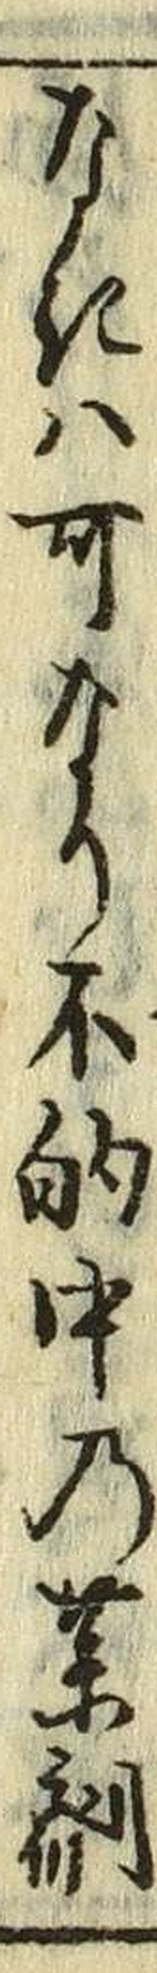なきは可なり不的中の薬剤
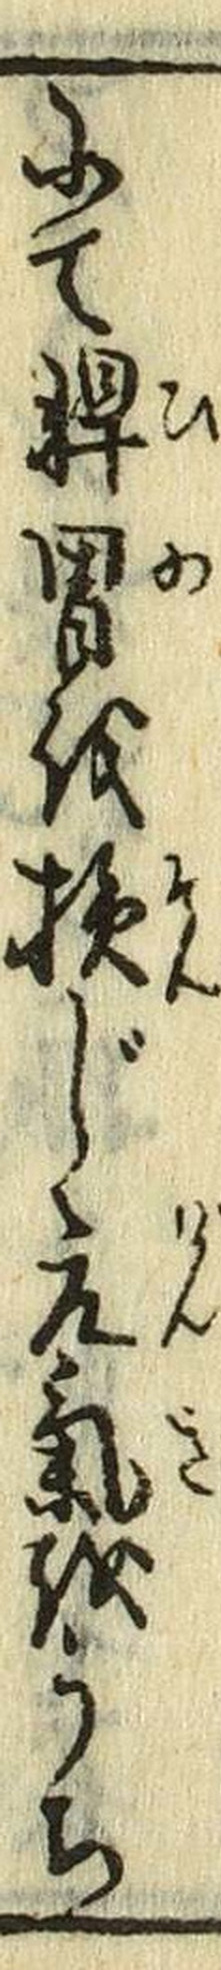にて脾胃を損じ元気をうち
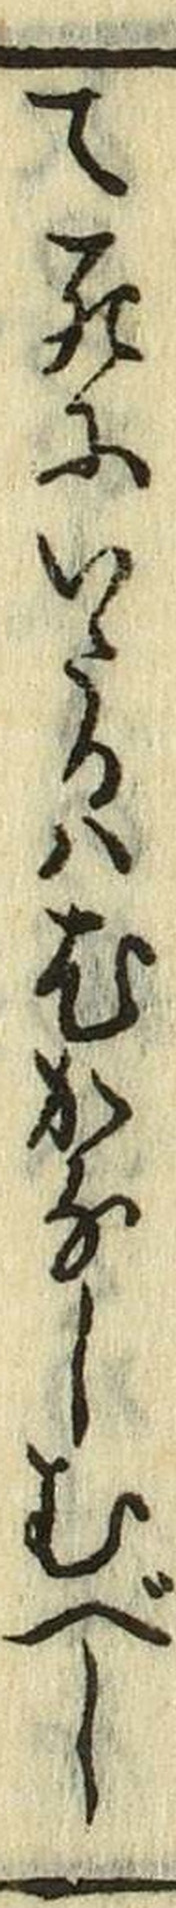て死にいたるは尤かなしむべし
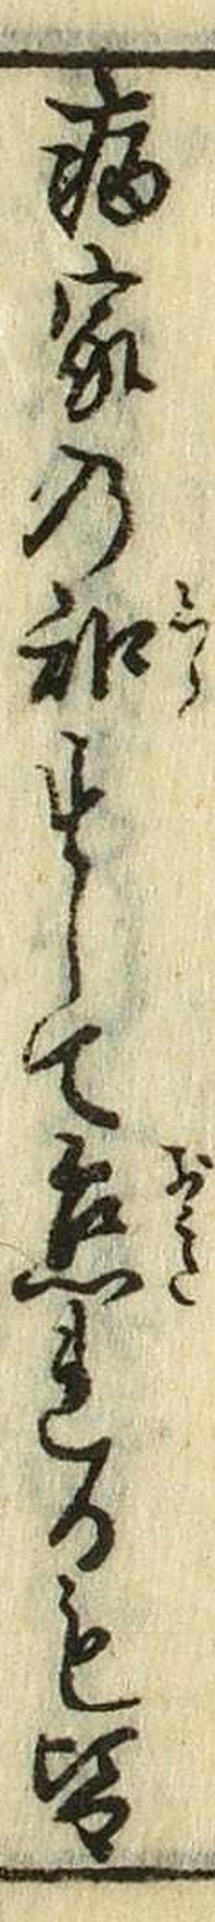病家の知すして怠れるも皆
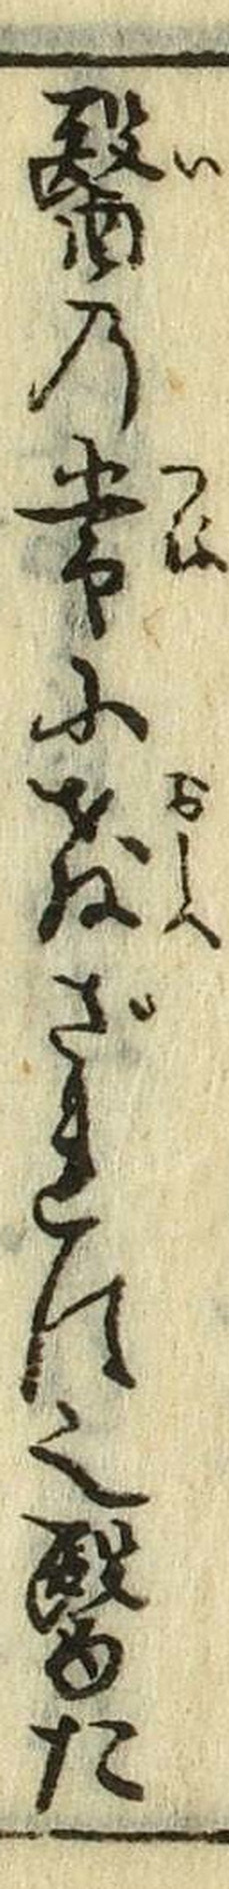医の常に教ざれは也医た
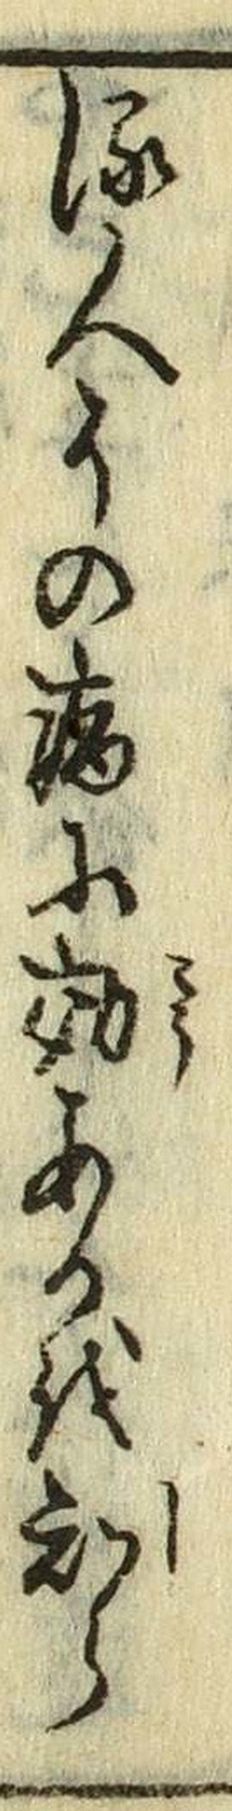る人その病に効あるを知ら
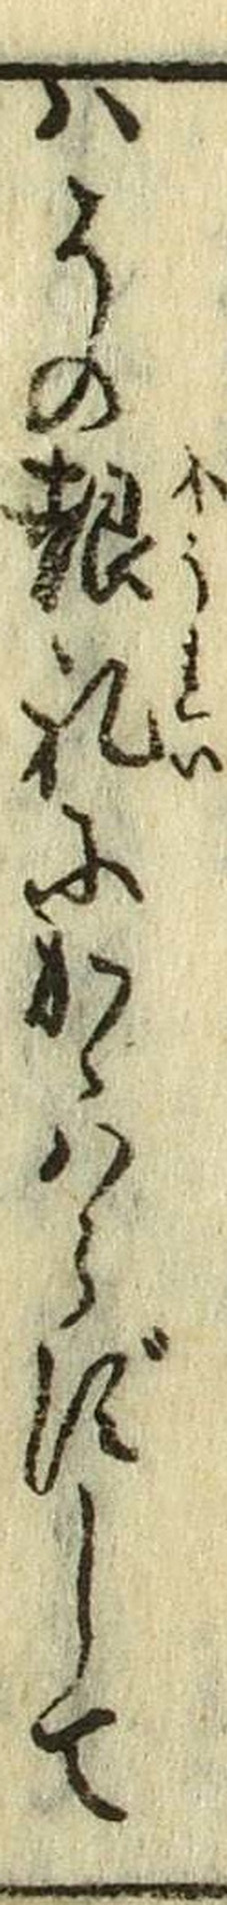はその報礼にかゝはらずして
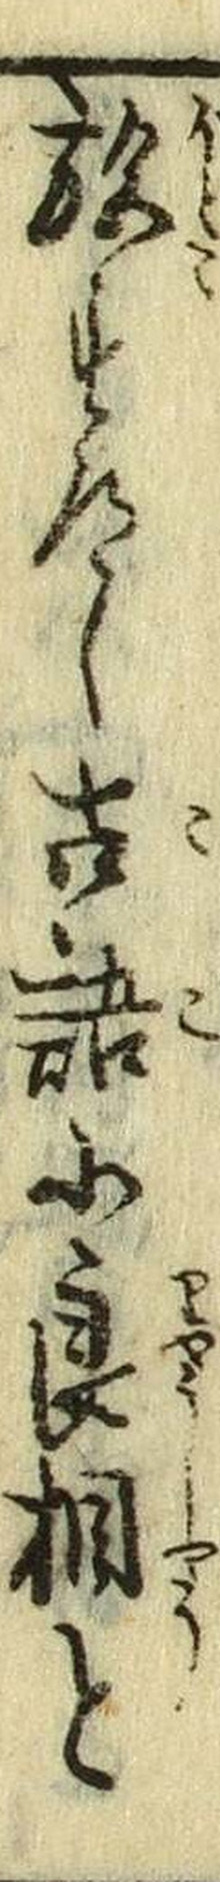施すへし古語に良相と

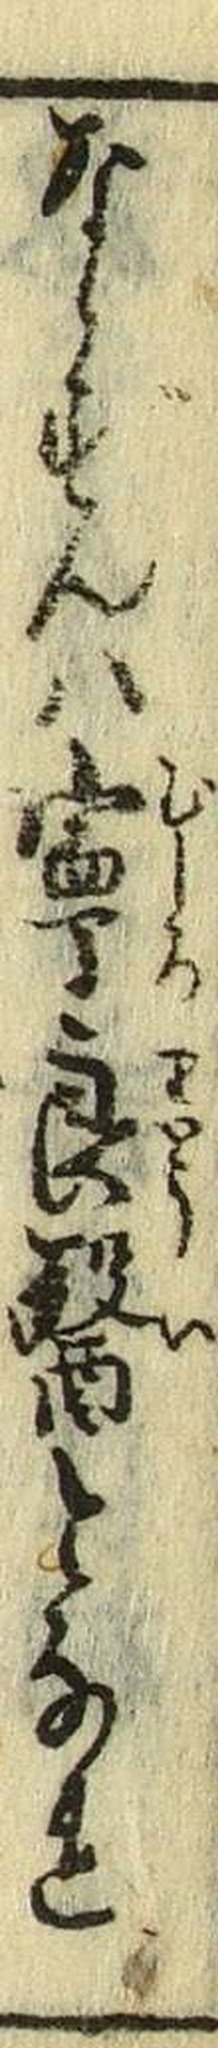ならずんは寧良医となれ
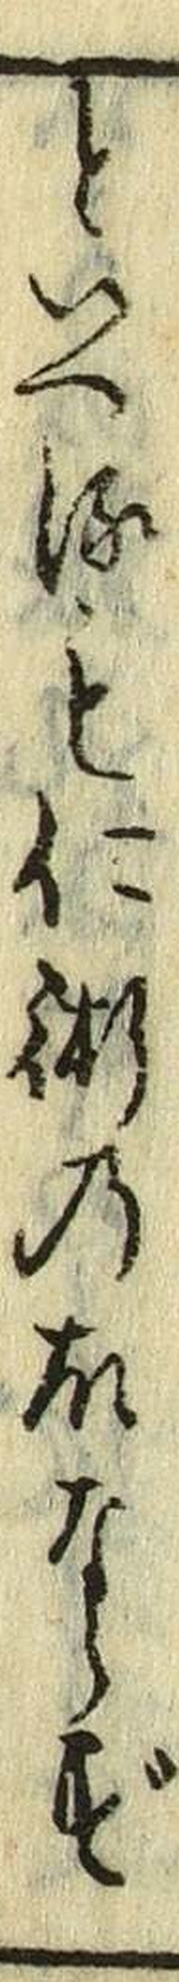といへるも仁術の故ならず
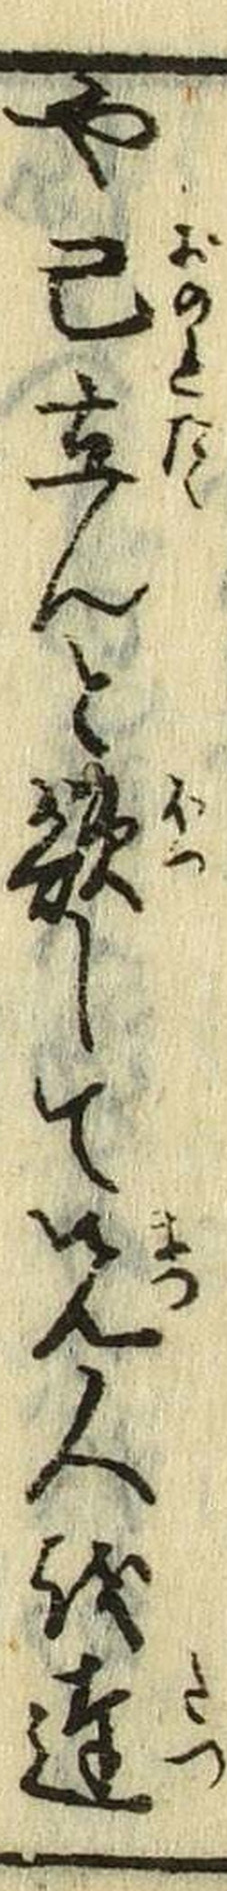や己立んと欲して先人を達
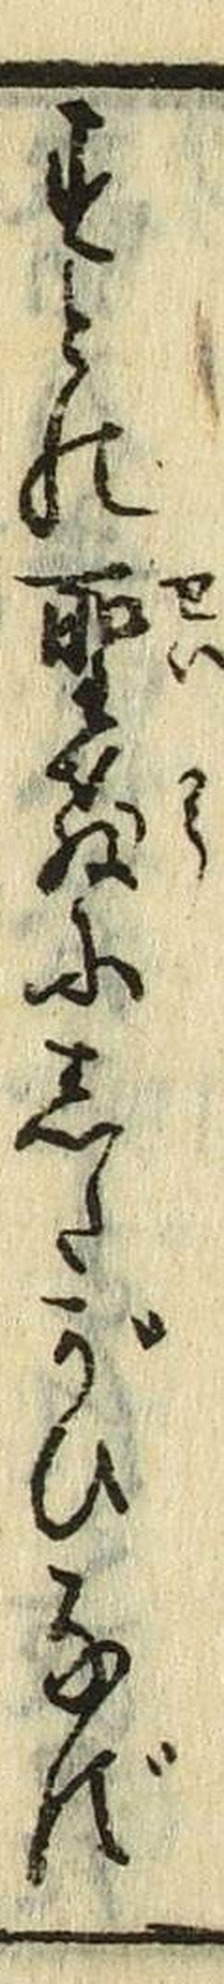すとの聖教にしたがひなば
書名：居家養生記
